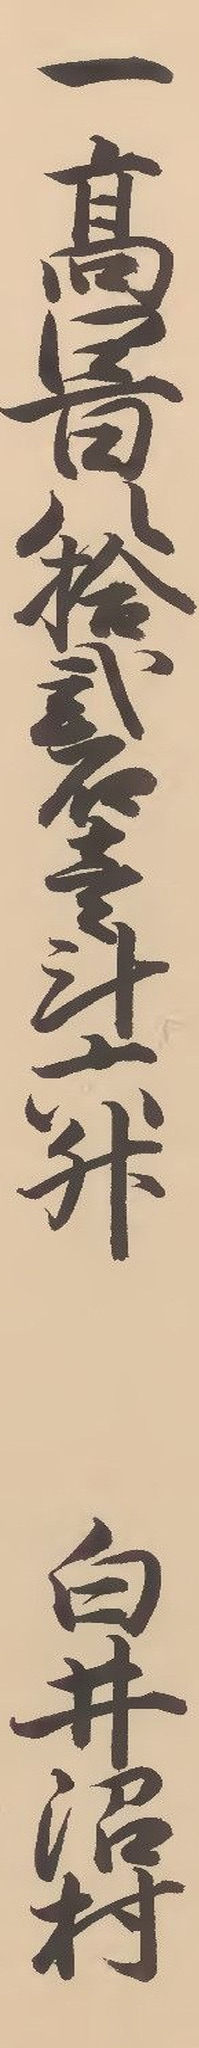一高四百八拾弐石壱斗六升白井沼村
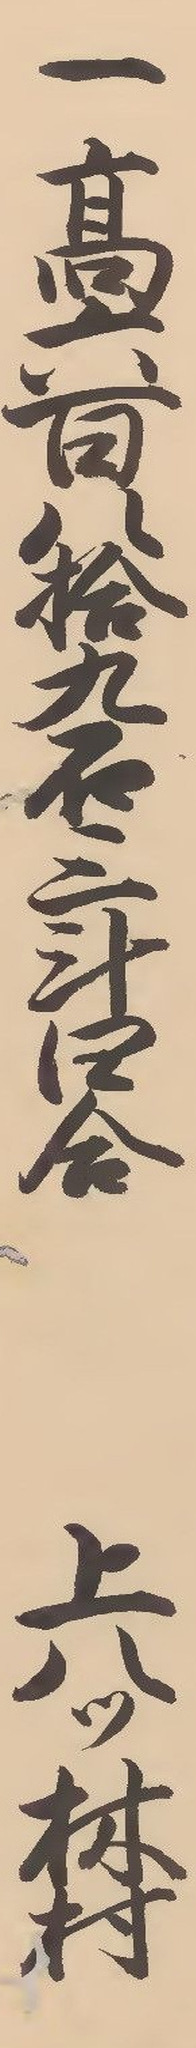一高六百八拾九石三斗四合上八ッ林村

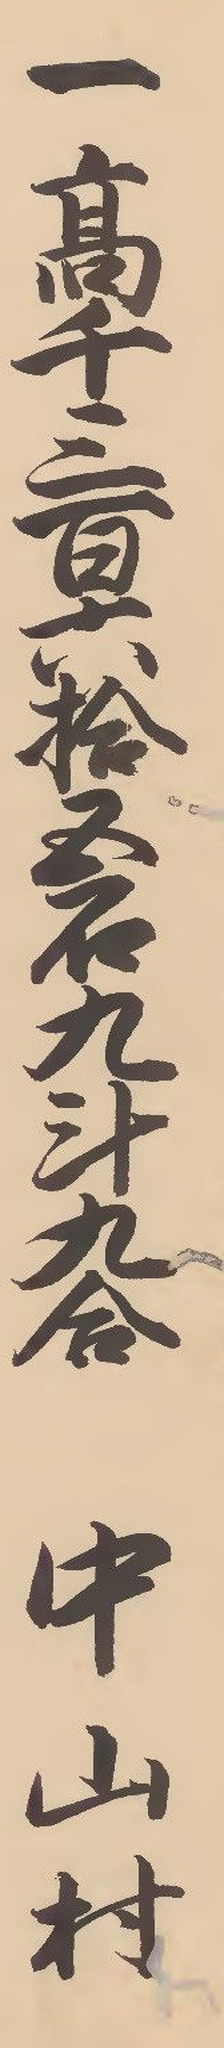一高千三百六拾五石九斗九合中山村
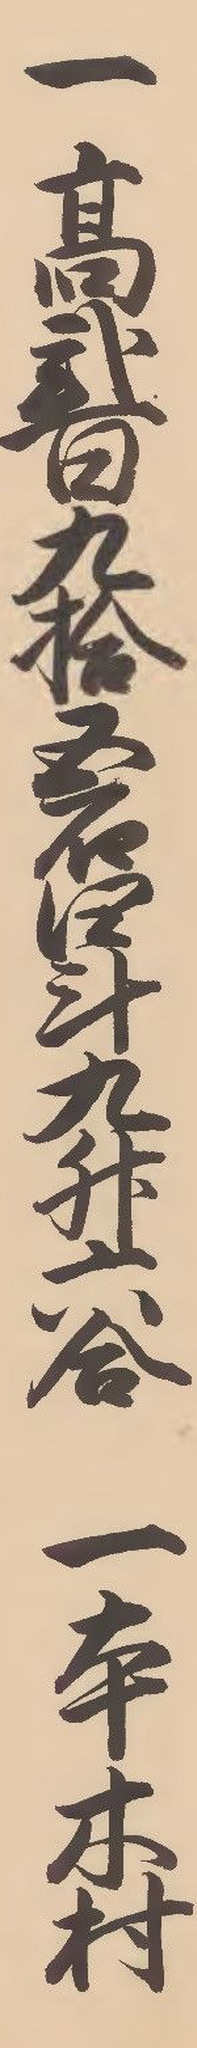一高弐百九拾五石四斗九升六合一本木村
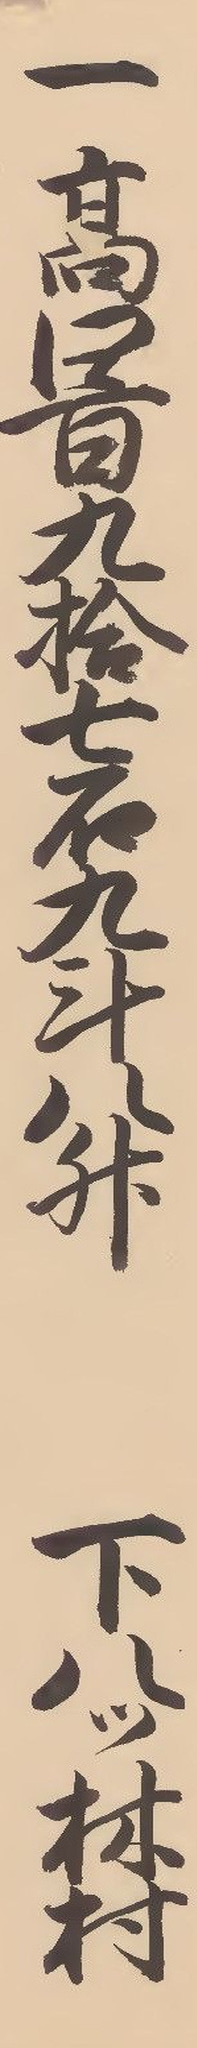一高四百九拾七石九斗八升下八ッ林村
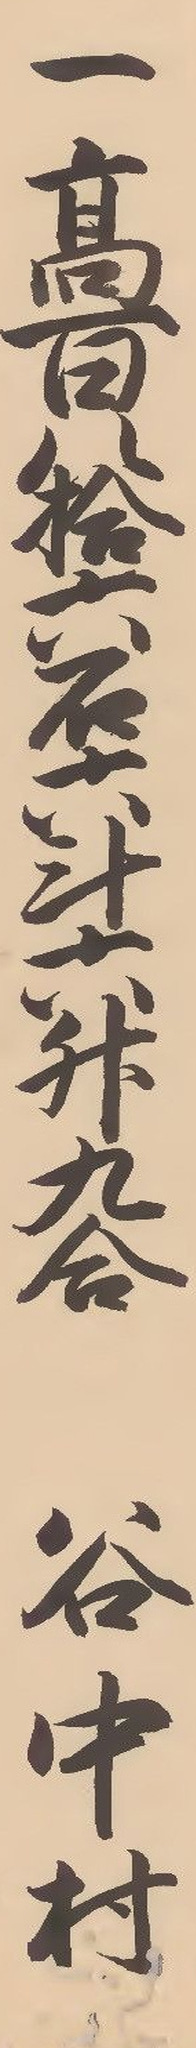一高百八拾六石六斗六升九合谷中村
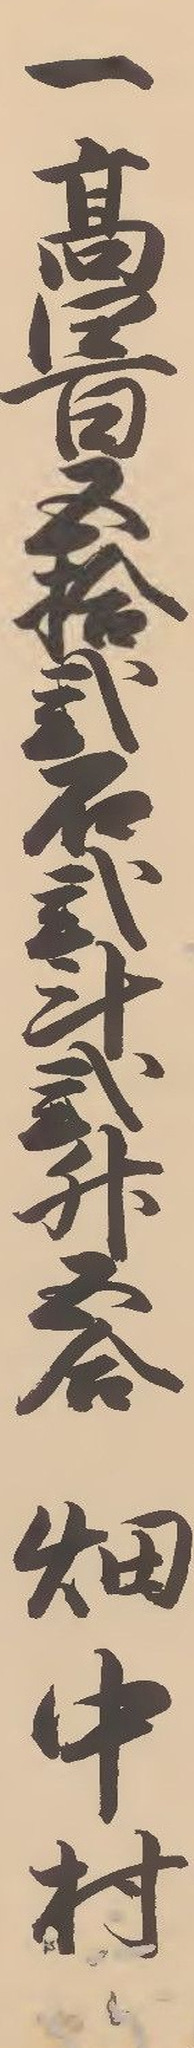一高四百五拾弐石弐斗弐升五合畑中村
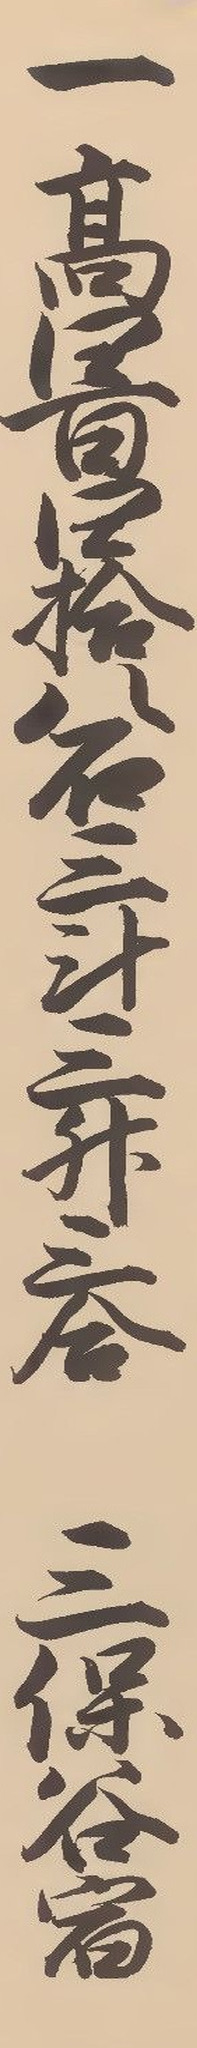一高四百四拾八石三斗三升三合三保谷宿
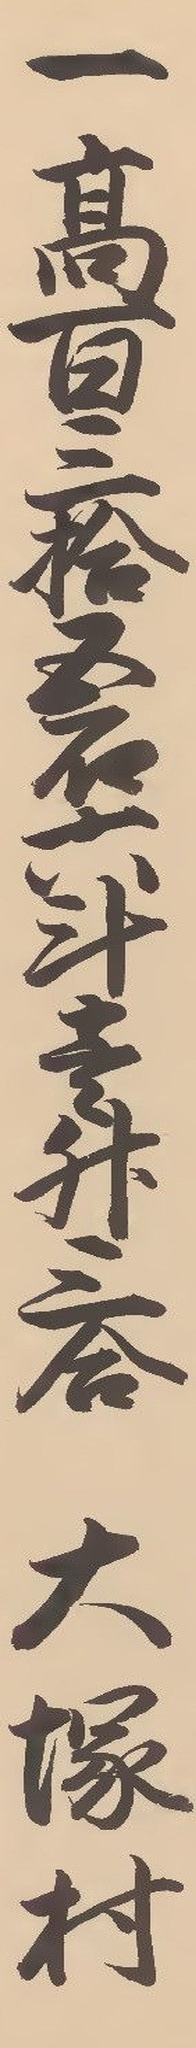一高百三拾五石六斗壱升三合大塚村
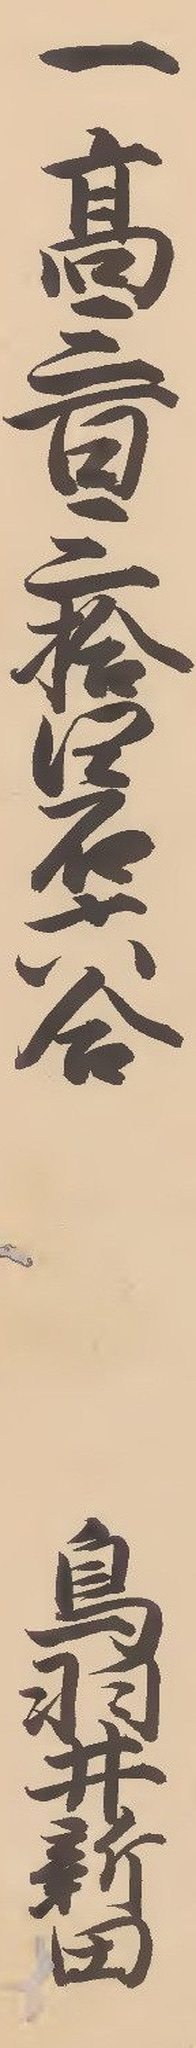一高三百三拾四石六合鳥羽井新田

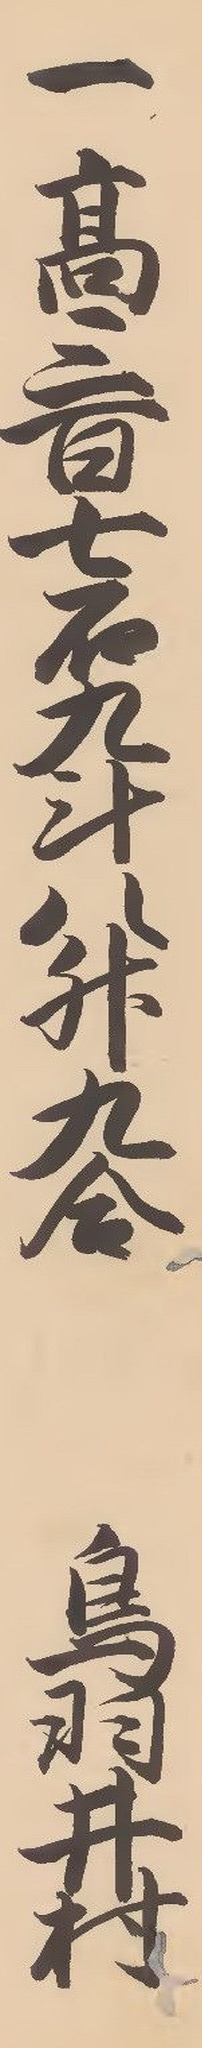一高三百七石九斗八升九合鳥羽井村
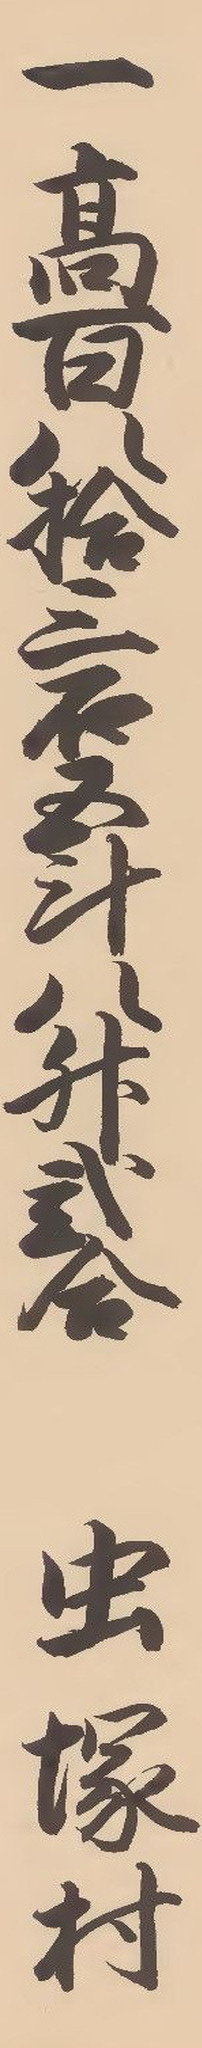一高百八拾三石五斗八升弐合虫塚村
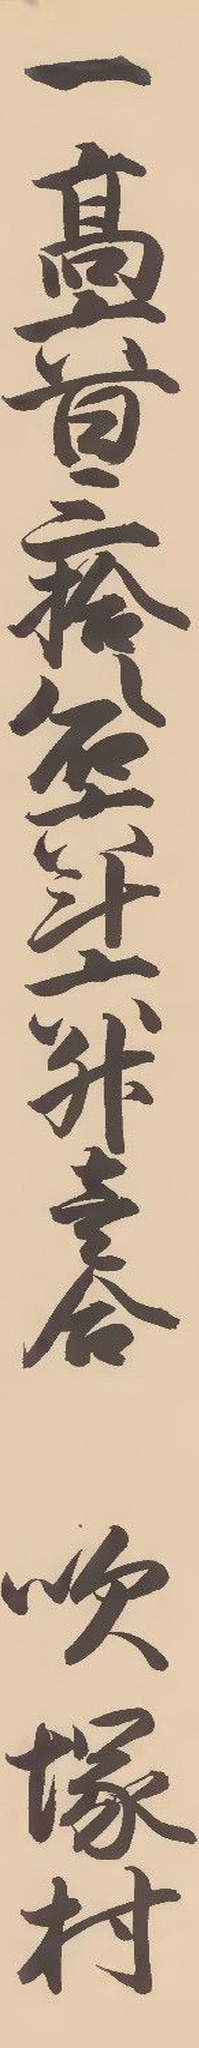一高六百三拾八石六斗六升壱合吹塚村
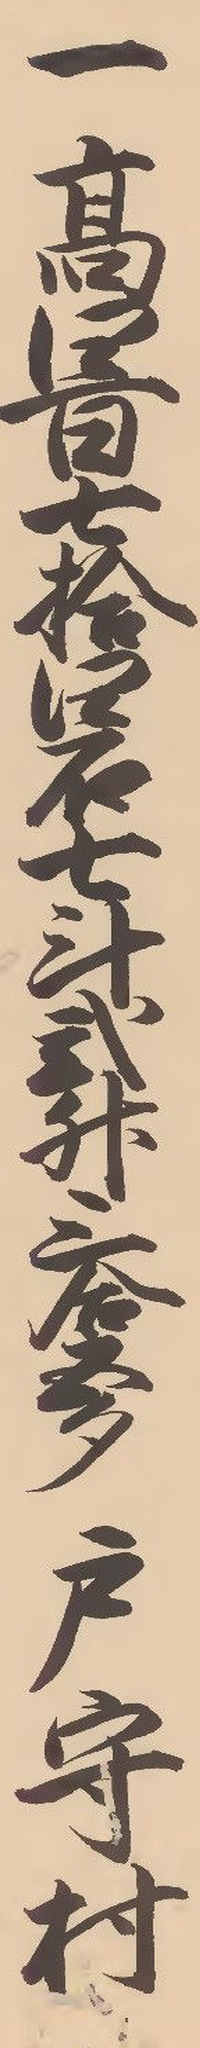一高四百七拾四石七斗弐升三合五勺戸守村
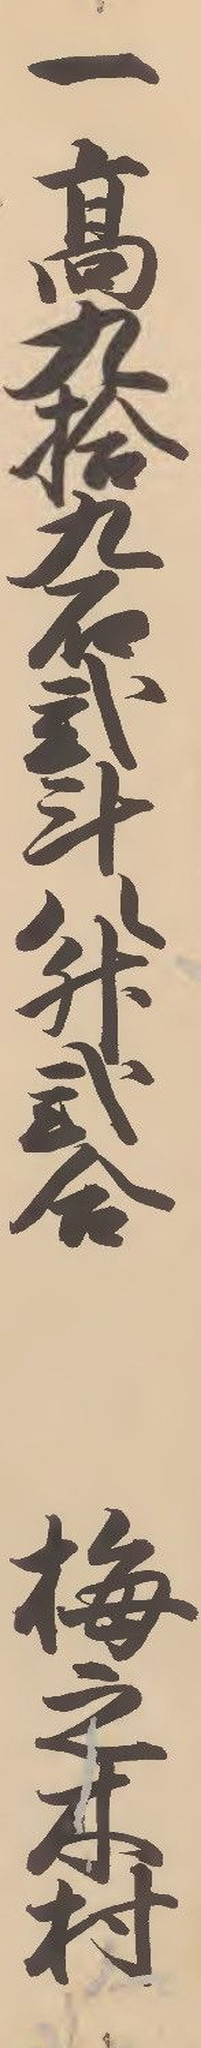一高九拾九石弐斗八升弐合梅之木村
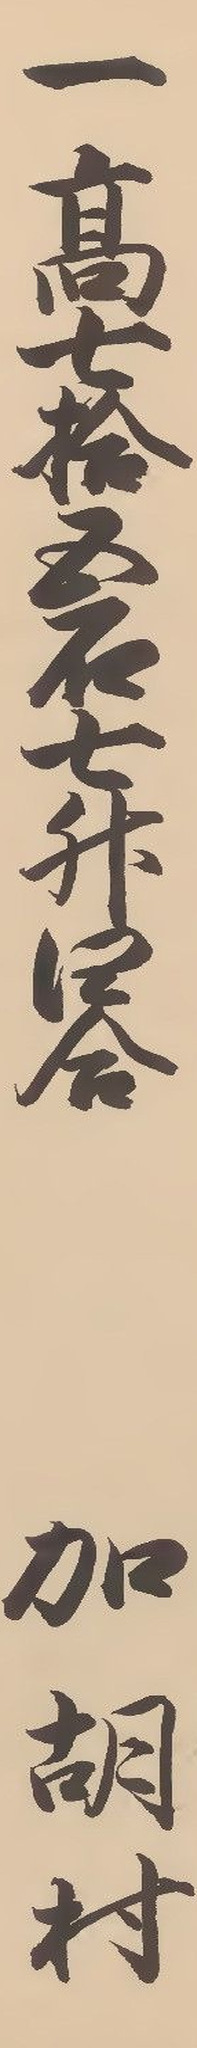一高七拾五石七升四合加胡村
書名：武蔵国郷帳　下
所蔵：国立公文書館 National Archives of Japan
